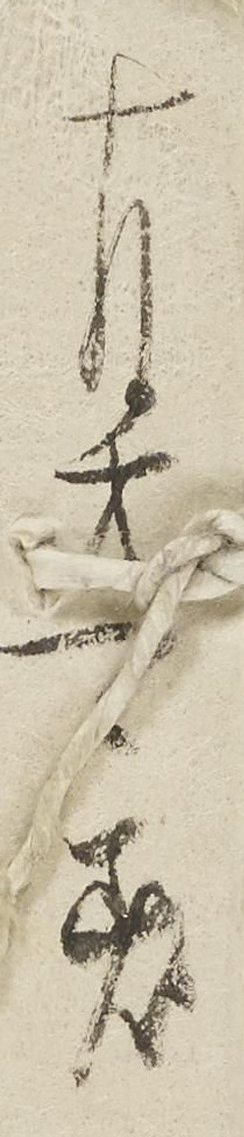十月廿一日着
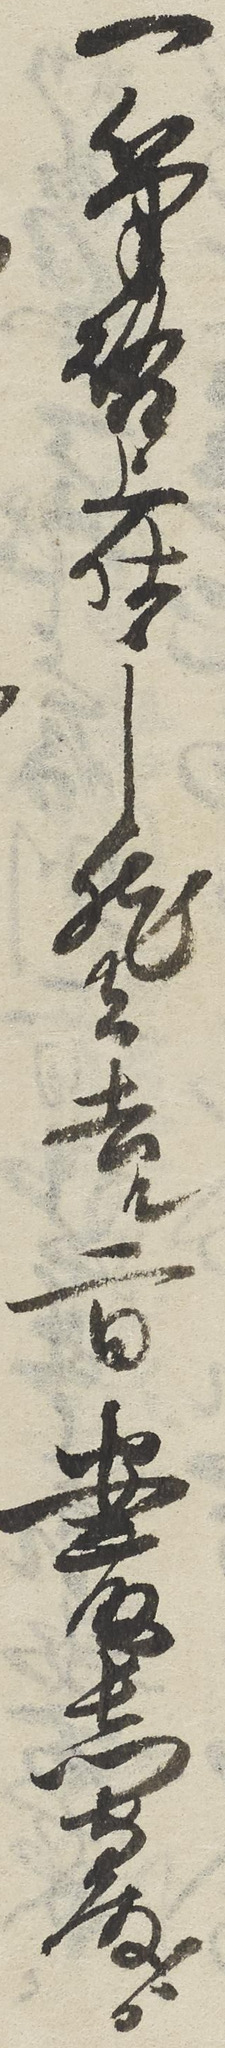一筆啓上仕候然者去ル二日安藤長門守殿ゟ
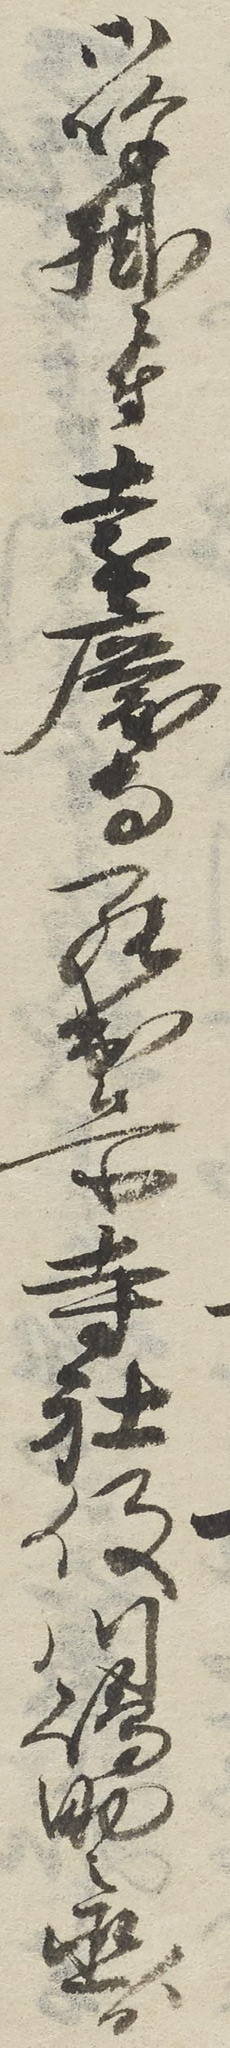御呼掛ニ付遠慶寺罷出候所寺社役川嶋助之丞ゟ
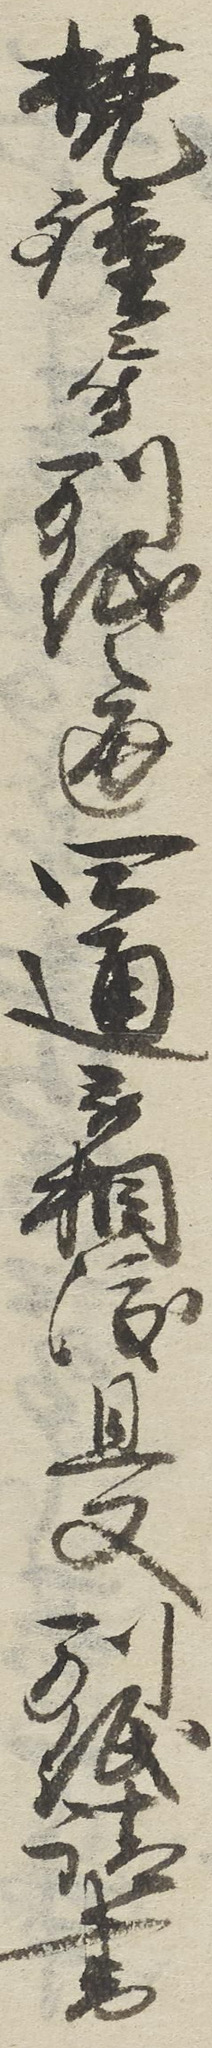梵鐘ニ付別紙之通四通被相渡且又別紙請書
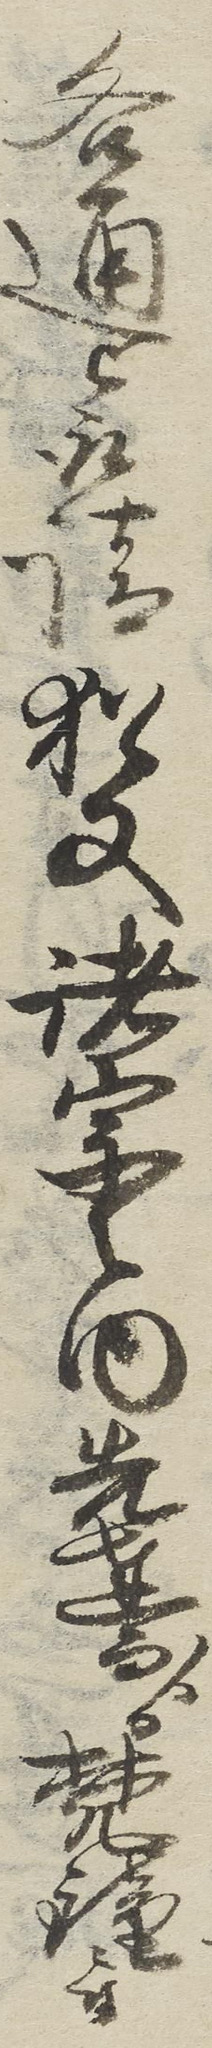各通被取請猶又諸宗之内先達而ゟ梵鐘ニ付
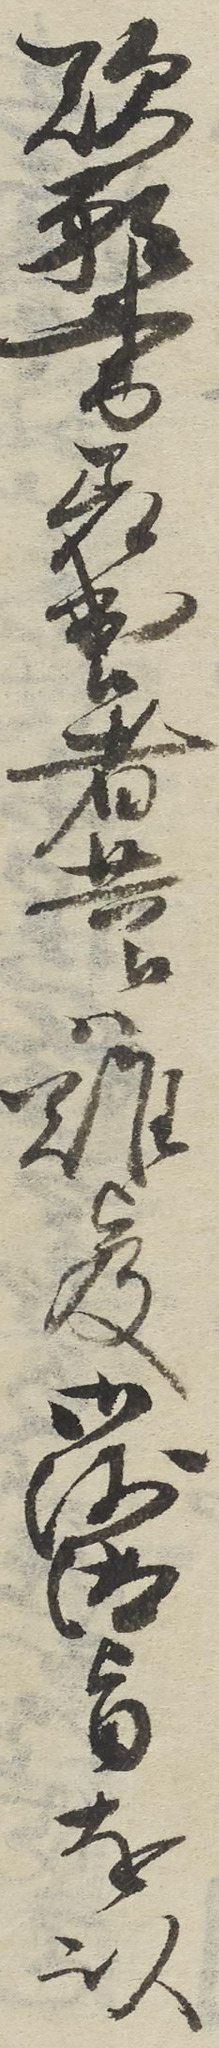歎願書差出候者共えは難被及御沙汰旨を以
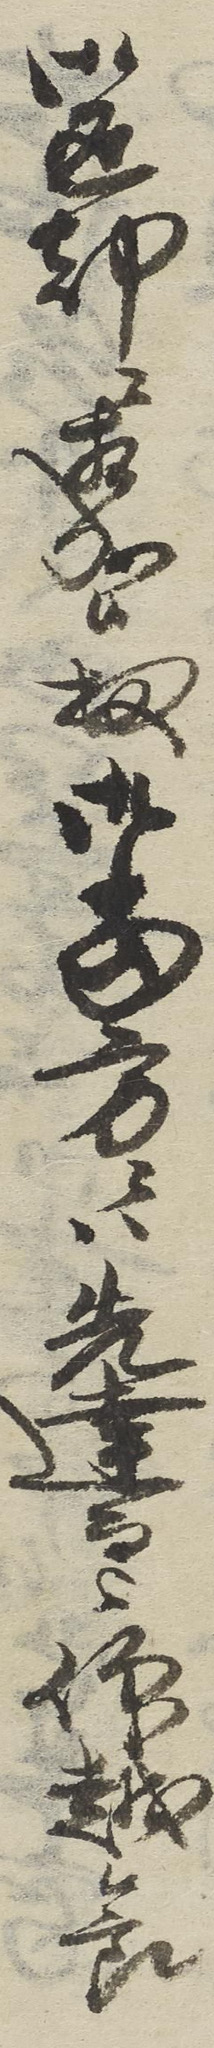御返却ニ相成候扨御当方ニは先達而被仰越候節

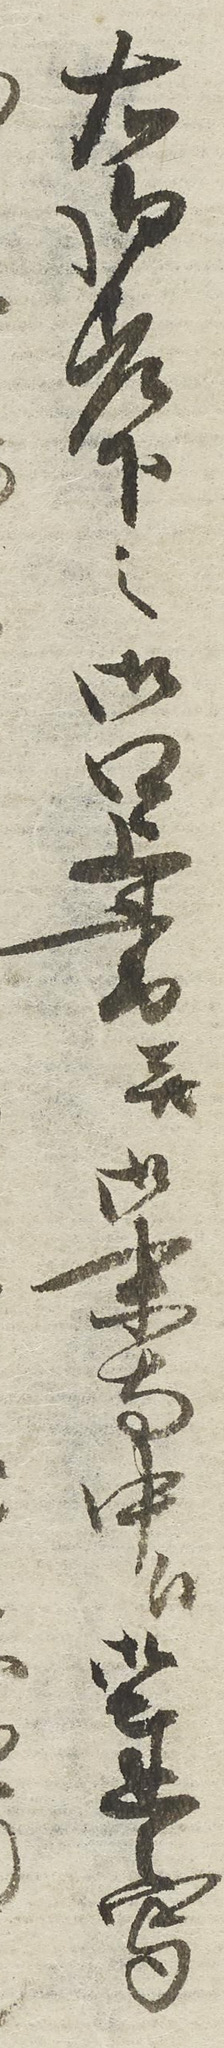右御差下之御口上書并御末寺中江御達之写
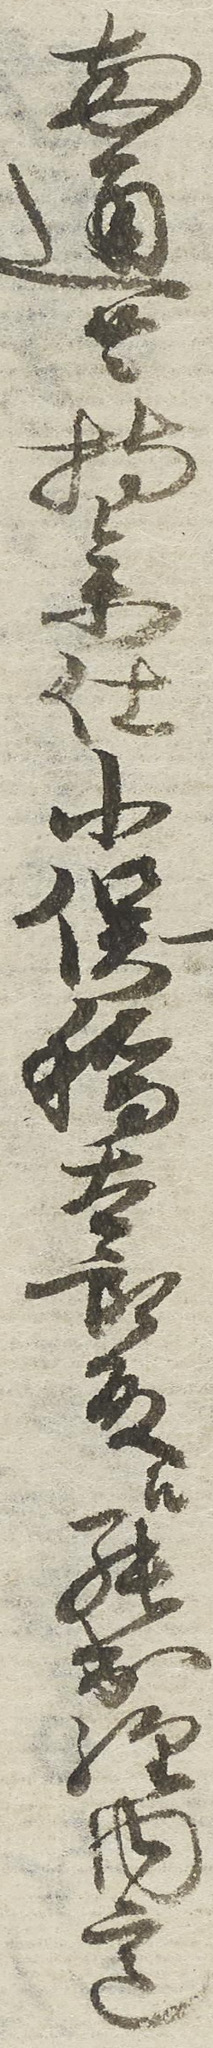両通共持参仕小俣稲太郎殿江罷出経内意
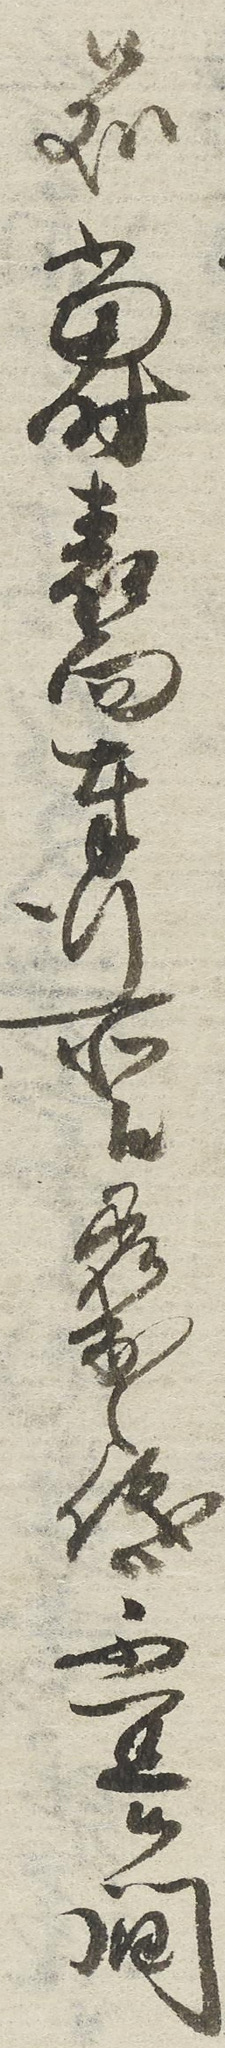候処当時表向奉行所江差出候儀ハ不宜候間
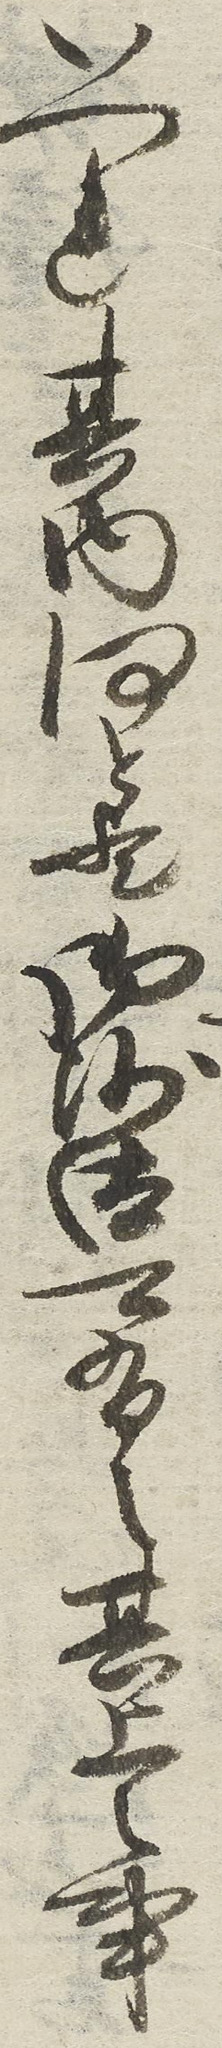いつれ其内何と歟御沙汰可有之其上之事
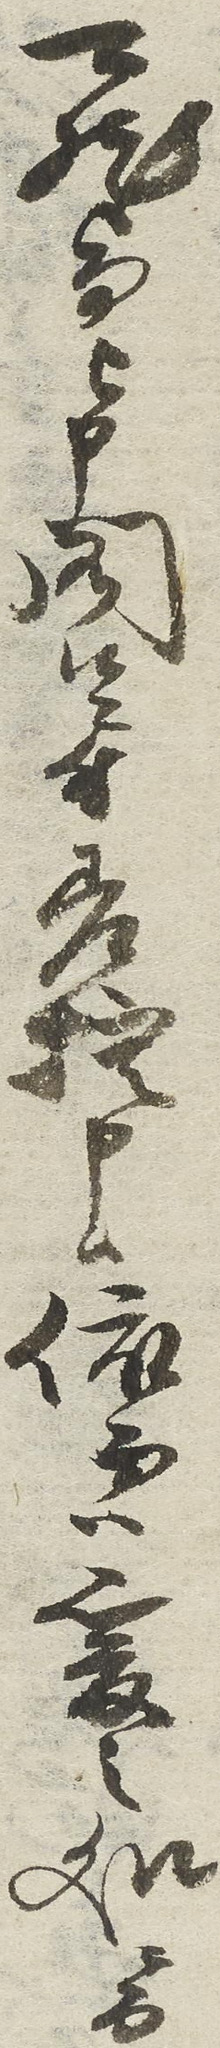可然旨被申聞候二付差控申候依而ハ爰之処二而
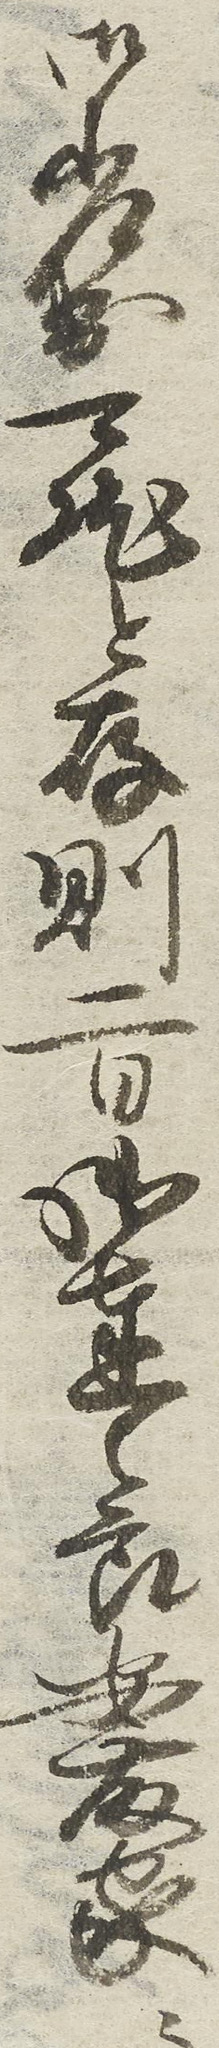御差出可然と存則二日御達之節安藤家二
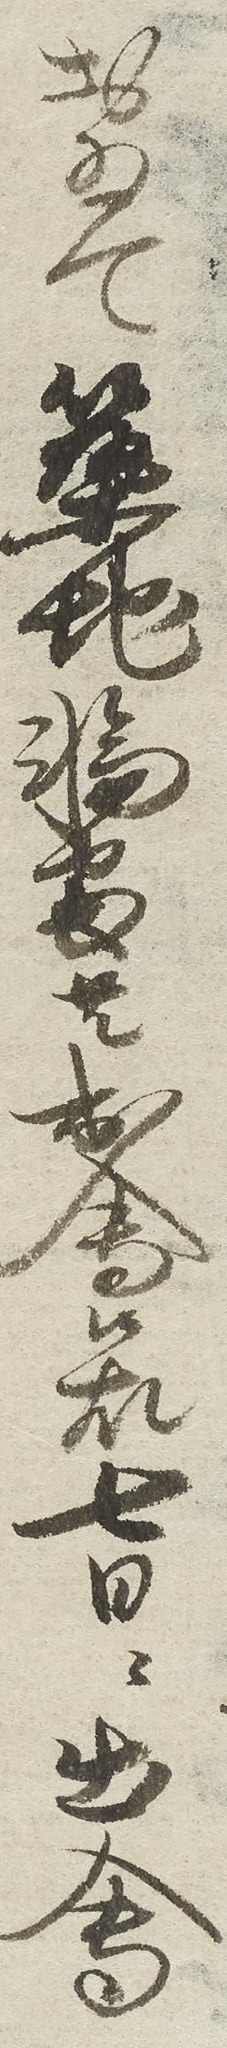おゐて築地輪番共出会候故七日二出会
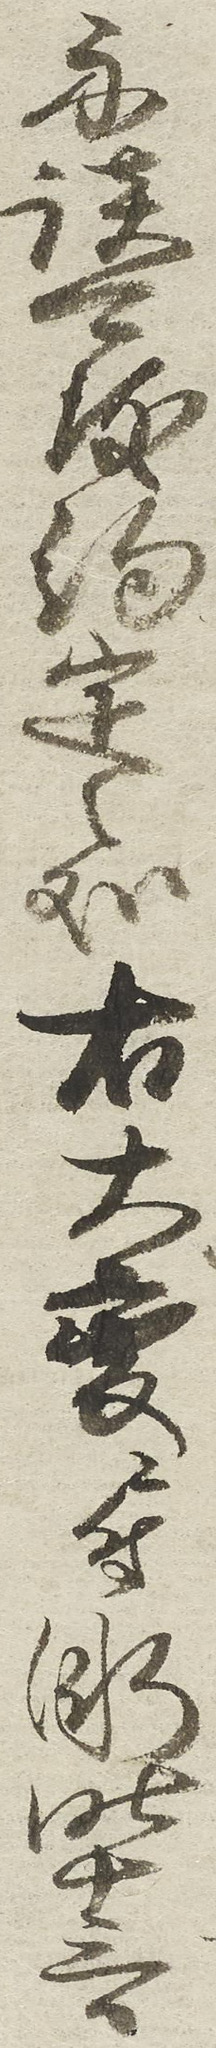示談可致約定候処右大変二付漸昨十三日
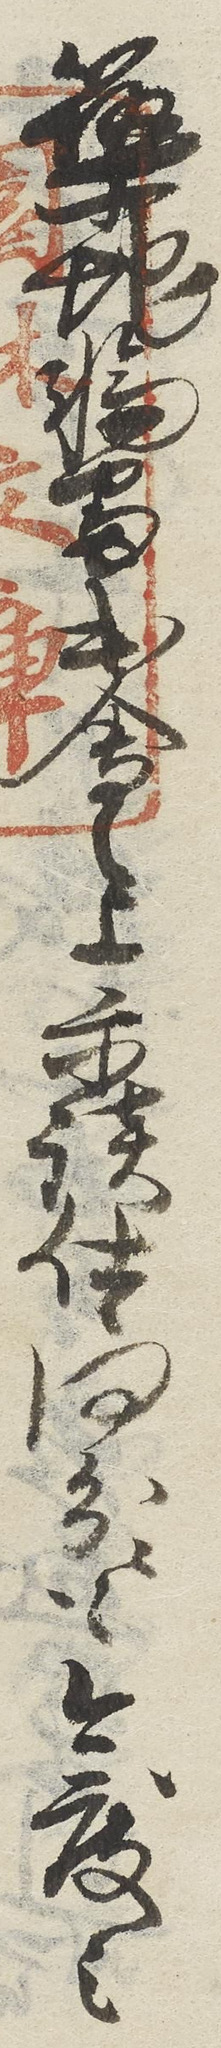築地輪番出会之上示談仕候何分二も今度之
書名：[梵鐘差出一件]
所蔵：東京大学地震研究所図書室 Earthquake Research Institute Library, The University of Tokyo, JAPAN
